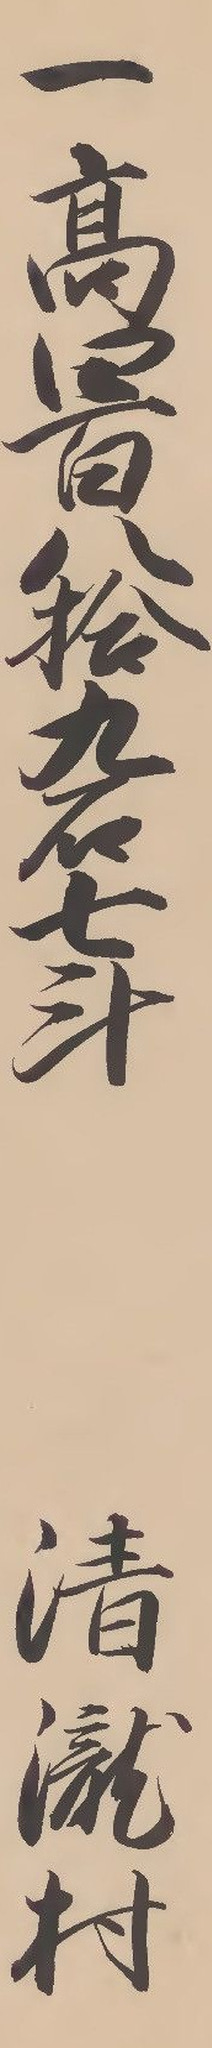一高四百八拾九石七斗清滝村
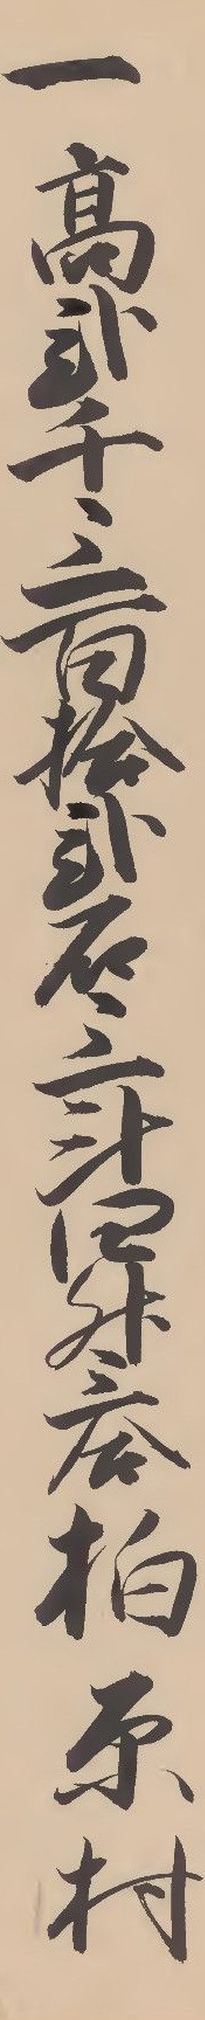一高弐千三百拾弐石三斗四升三合柏原村
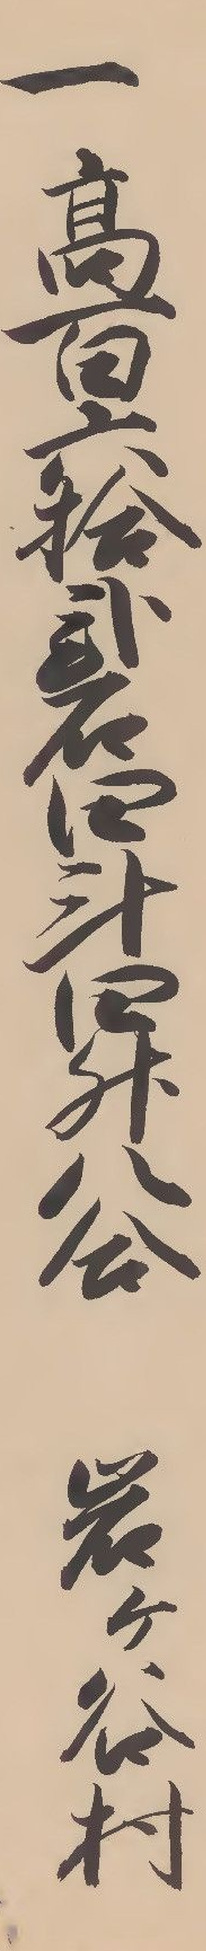一高百六拾弐石四斗四升八合岩ケ谷村
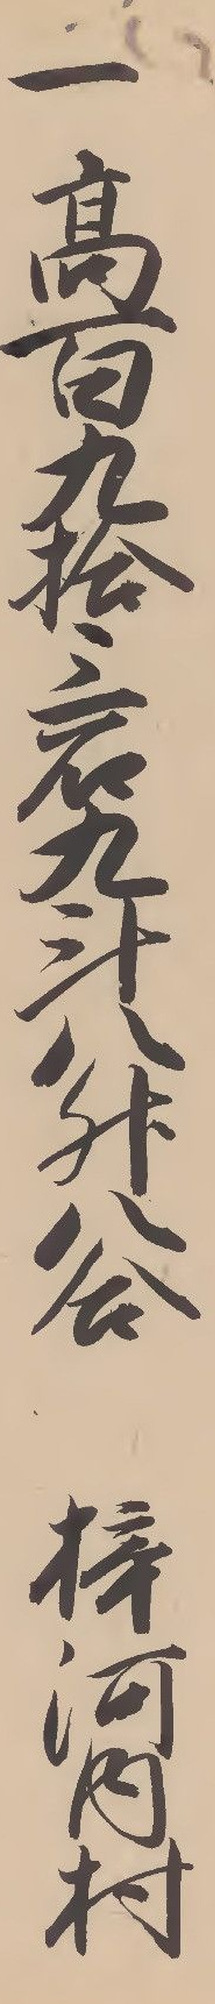一高百九拾三石九斗八升八合梓河内村
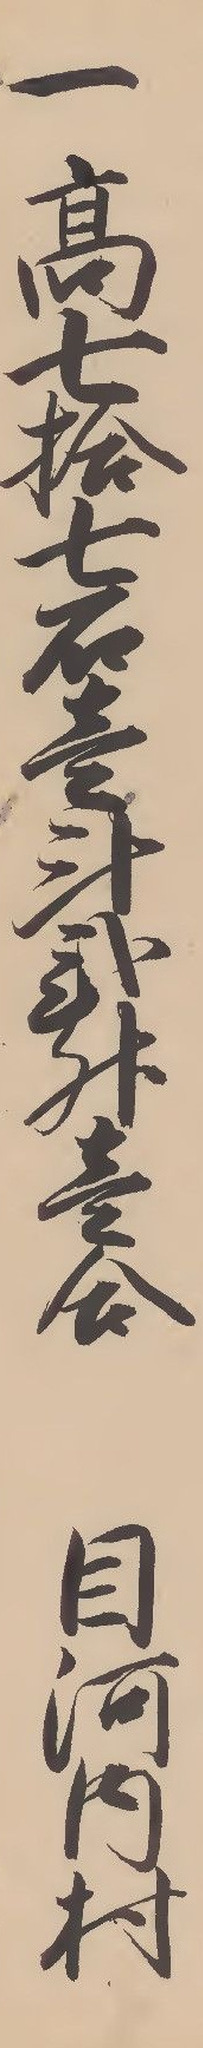一高七拾七石壱斗弐升壱合目河内村

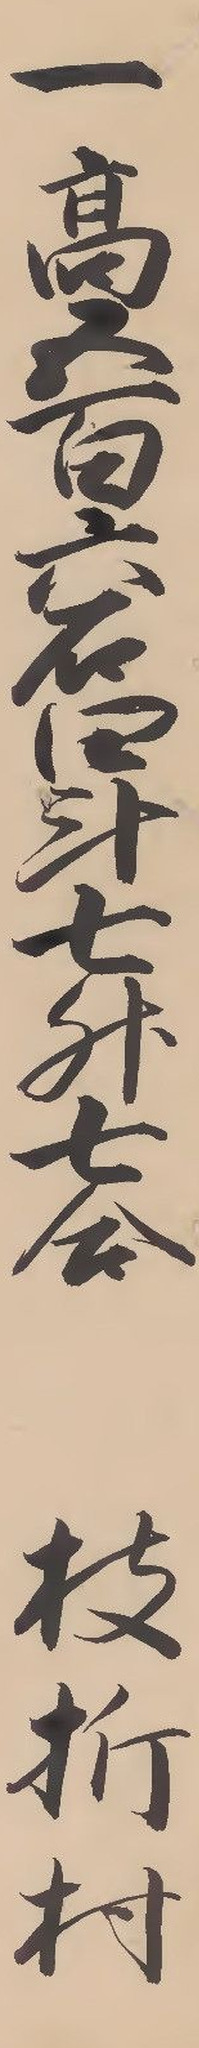一高五百六右四斗七升七合枝折村
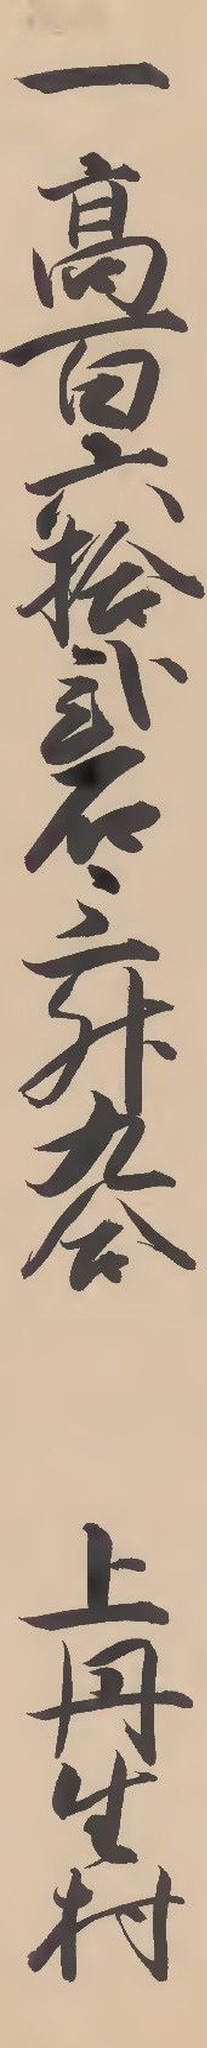一高百六拾弐石三升九合上丹生村
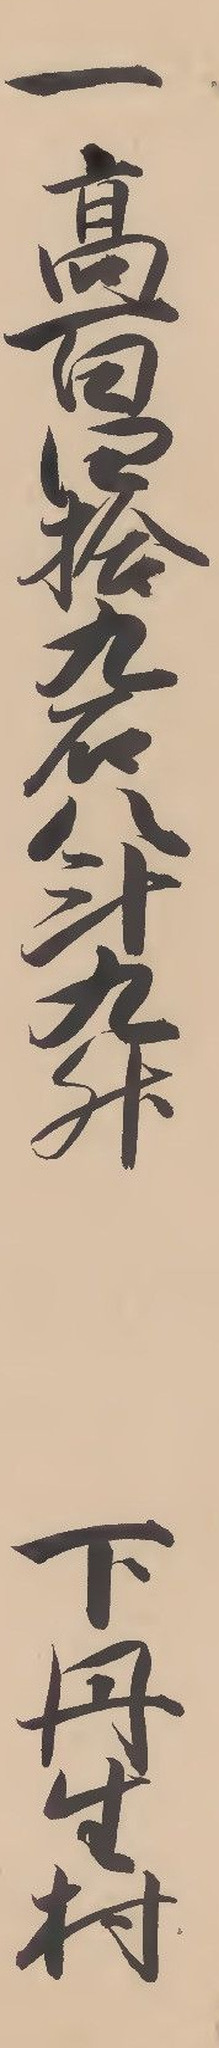一高百四拾九石八斗九升下丹生村
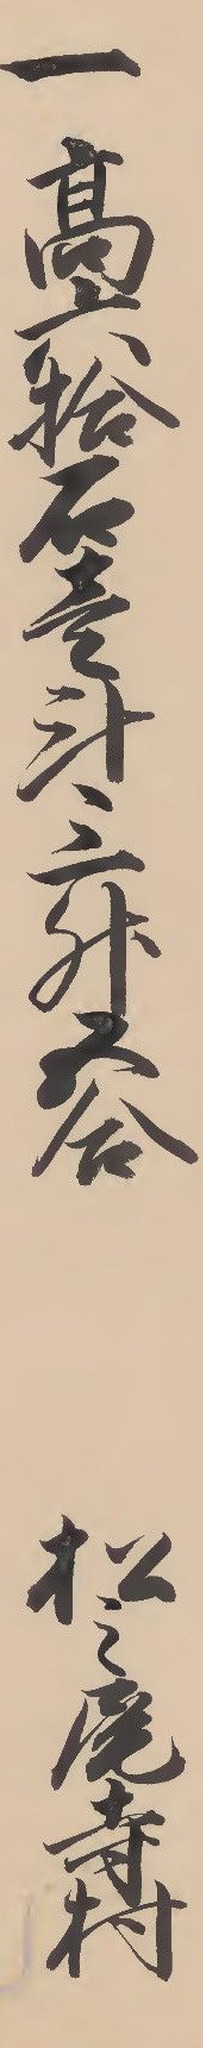一高六拾石壱斗三升五合松之尾寺村
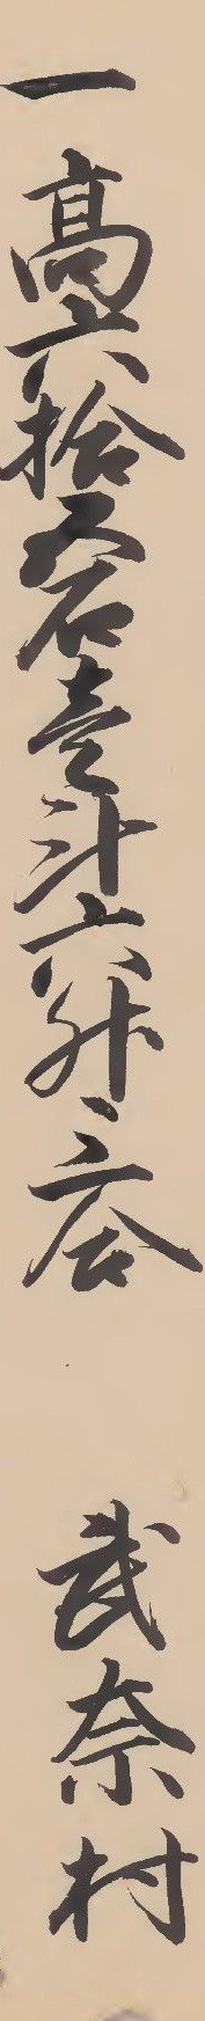一高六拾五石壱斗六升三合武奈村
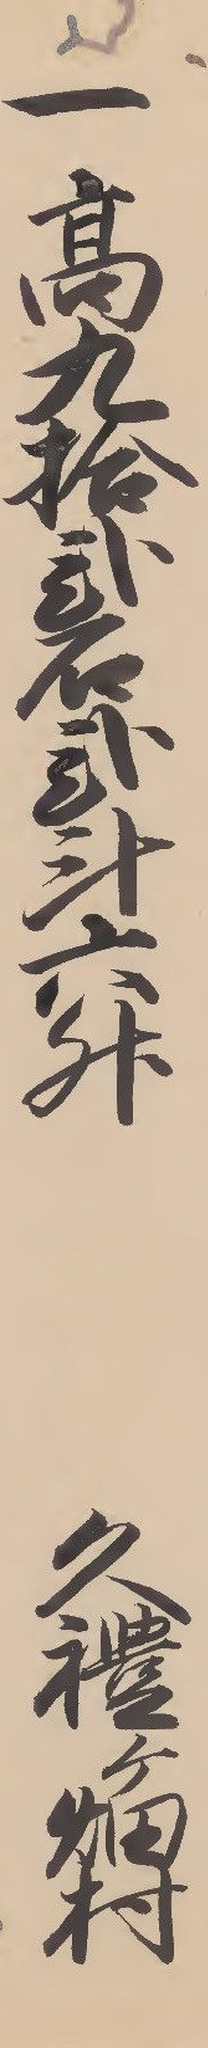一高九拾弐石弐斗六升久礼ヶ畑村
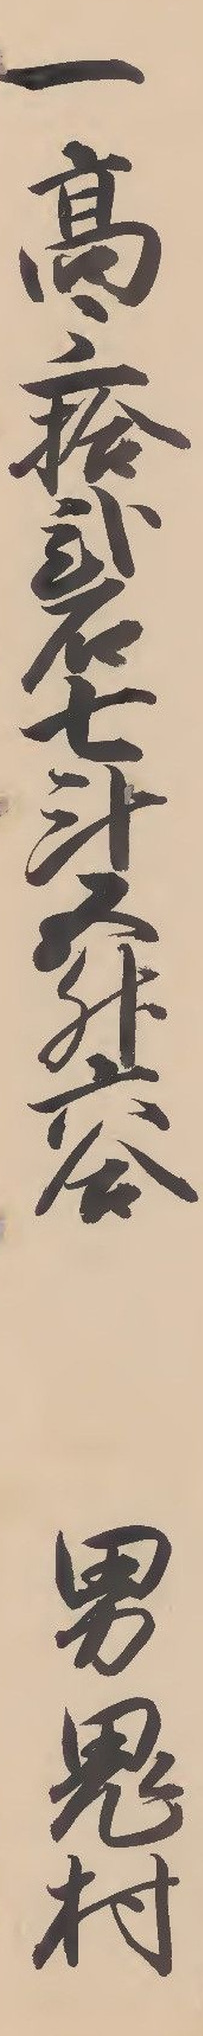一高三拾弐石七斗五升六合男鬼村

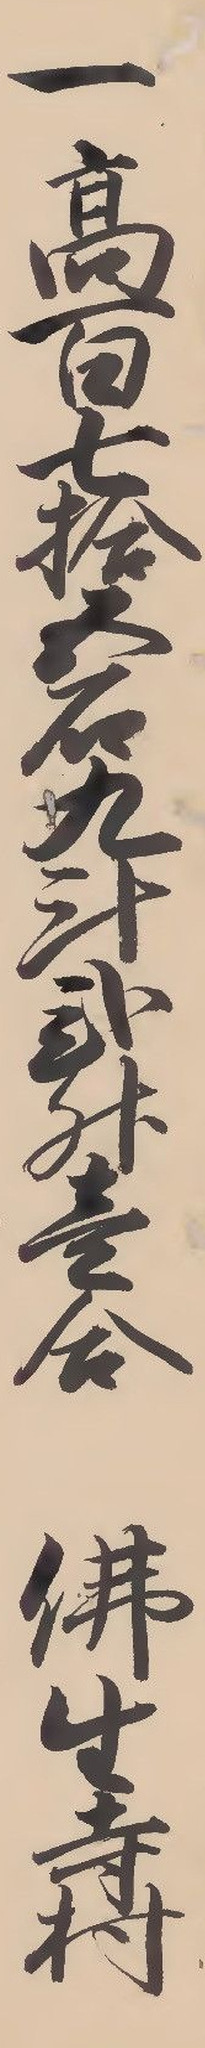一高百七拾五石九斗弐升壱合仏生寺村
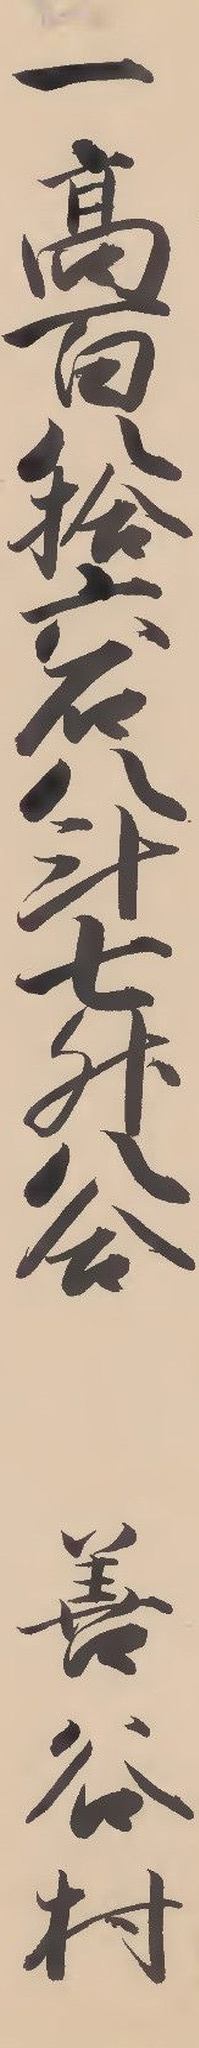一高百八拾六石八斗七升八合善谷村
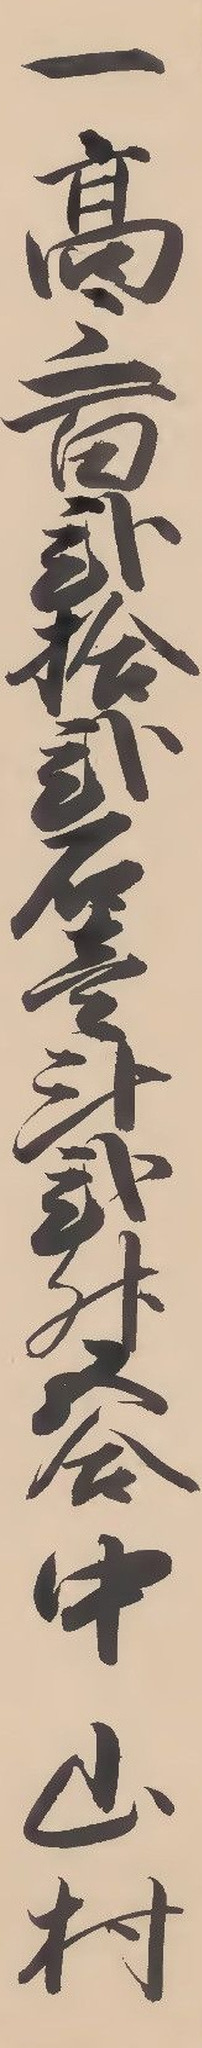一高三百弐拾弐石壱斗弐升五合中山村
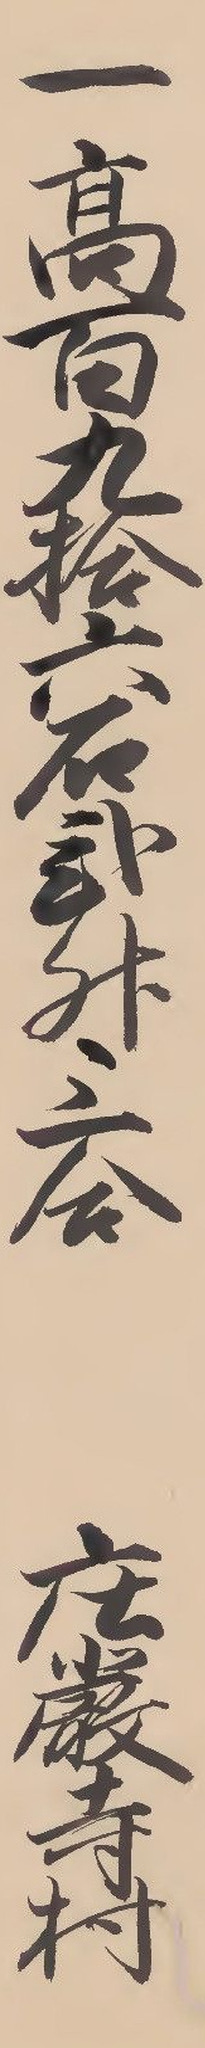一高百九拾六石弐升三合庄厳寺村
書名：近江国郷帳
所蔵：国立公文書館 National Archives of Japan
